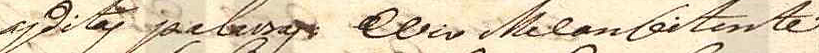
as ditas palavras: E uio elle confitente
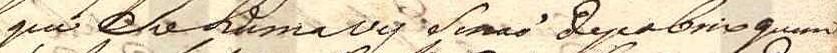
que se huma ves senaõ descobrio quem
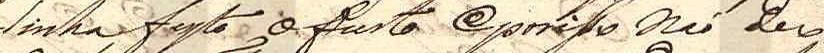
tinha feyto o furto E por isso naõ deo
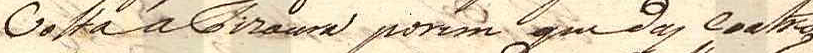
Uolta a Tizoura porem que das coatro
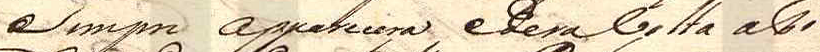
Sempre apparecera e dera Uolta a Ti
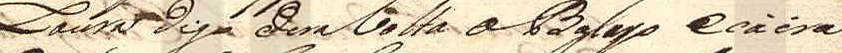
Zoura digo dera Uolta o Balayo e caira
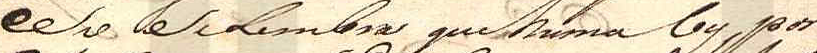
e se se Lembra que huma Ves, por
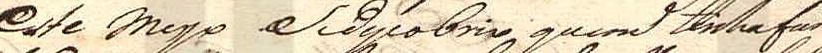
este meyo se descobrio quem tinha fur
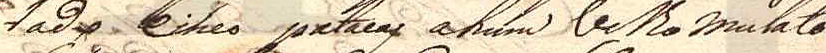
tado cinco patacas a hum Velho mulato
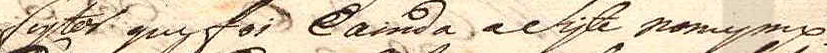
feytor que foi E ainda aSiste no mesmo
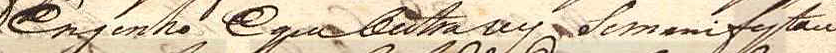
Engenho E que Outra ves se manifestou
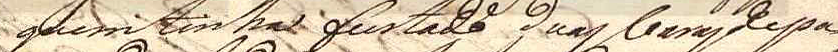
quem tinha furtado duas Uaras de pa
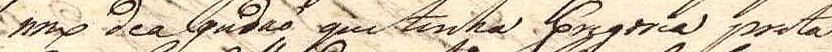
nno de algudaõ que tinha Gregoria preta
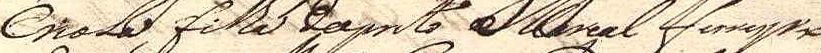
CrioLa filha do preto Marçal ferreyro
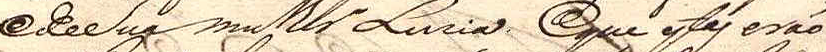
E de Sua mulher Luzia E que estas eraõ
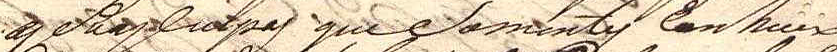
as Suas culpas que Somentes conheceo
